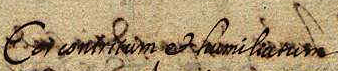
E os contritum & humiliarum
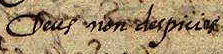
Deus non despicies
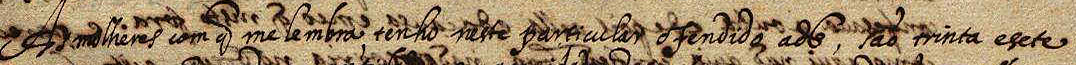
As molheres com q̄ me lembra, tenho neste particular ofendido a ds̄, saõ trinta e sete
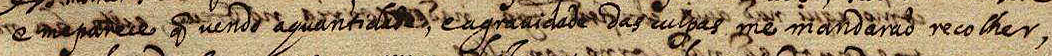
e me parece q̄ uendo a quantidade, e a grauidade das culpas me mandarão recolher,
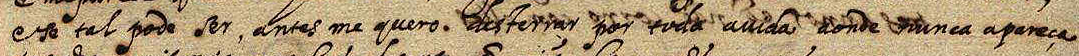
e se tal pode ser, antes me quero desterrar por toda a uida aonde nunca apareça
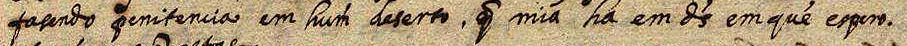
fasendo penitencia em hum̄ deserto, q̄ miā ha em ds̄ em quē espero.
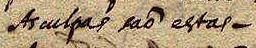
As culpas saõ estas -
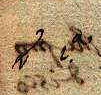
item 1.a
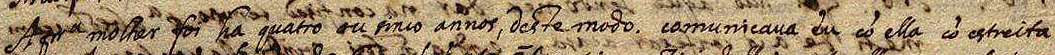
A pra molher foi ha quatro ou sinco annos, deste modo. comunicaua eu cō ella cō estreita
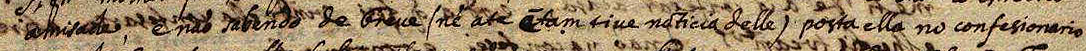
amisade, e não sabendo de breue (nē ate ētam tive noticia delle) posta ella no confesionario
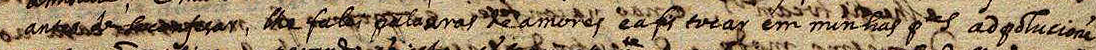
antes de se confesar, lhe falei palauras de amores e a fis tocar em minhas ptes ad polucionē
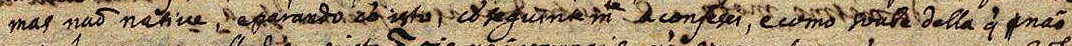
mas naõ na tiue, e parando cō isto, cōseguintemte a confesei, e como soube della q̄ a naõ
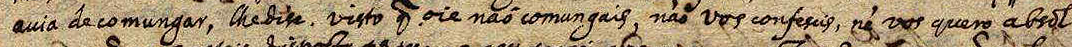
auia de comungar, lhe dise visto q̄ oie naõ comungais, não vos confeseis, nē vos quer absol
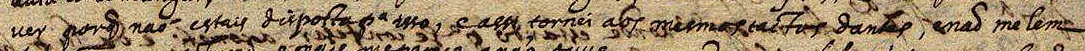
uer porq̄ naõ estais disposta pa isso, e assi tornei aos mesmos tactos dantes, e naõ me lem
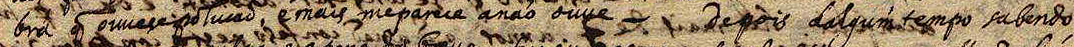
bra q̄ ouuese poluçaõ, e mais me parece a naõ ouue - depois dalgum tempo sabendo
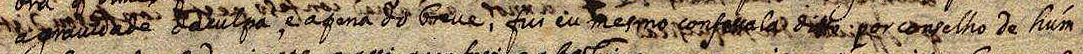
a grauidade da culpa, e a pena do breue, fui eu mesmo confessala ditto por conselho de hum̄
